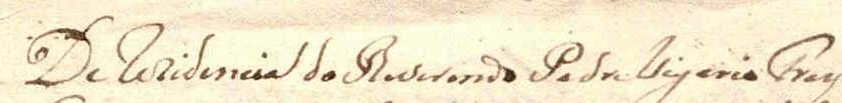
De Rezidencia do Reverendo Padre Vigario Frey
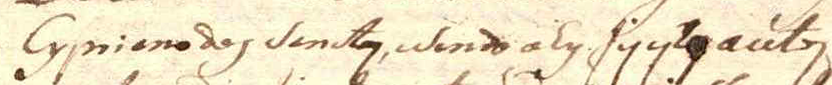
Cypriano dos Santos, e sendo ahy fis estes autos
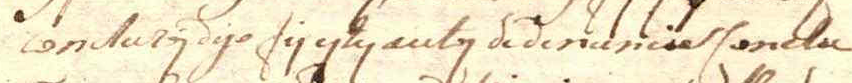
concluzos digo fis estes autos de denuncia Conclu
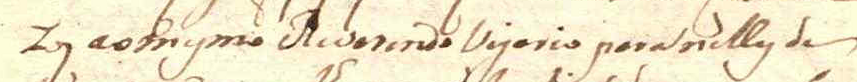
Zos ao mesmo Reverendo Vigario para nelles de
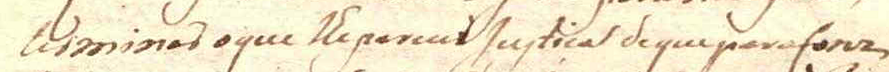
terminar o que lhe parecer Justiça de que para Conz
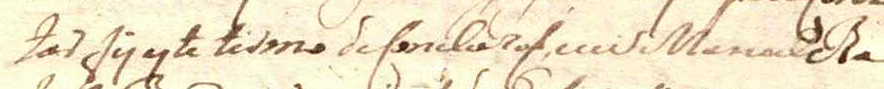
tar fis este termo de Concluzaõ, e eu Manoel Ra
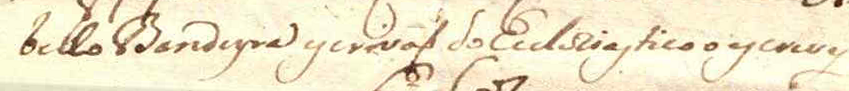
bello Bandeyra escrivaõ do Eccleziastico o escrevy
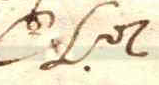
CL.os
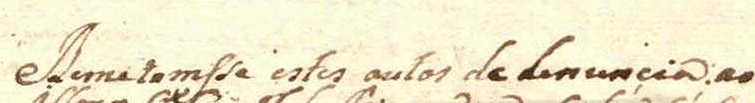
Remetamsse estes autos da denuncia ao
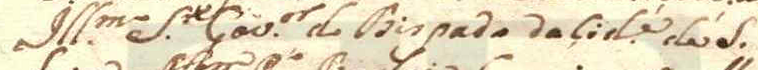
Ill.m S.r Gov.or do Bispado da Cid.e de S.
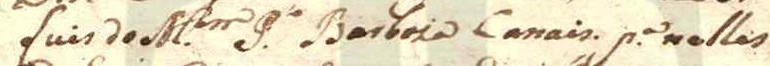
Luis do M.am P.o Barboza Canais. p.a nelles
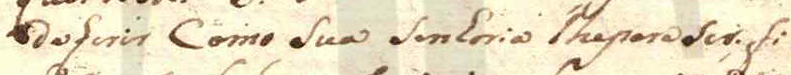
deferir Como sua Senhoria lhe pareser, fi
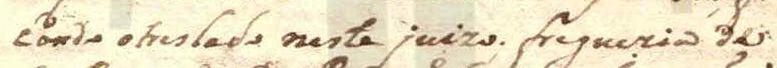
cando o treslado neste juizo; freguezia de
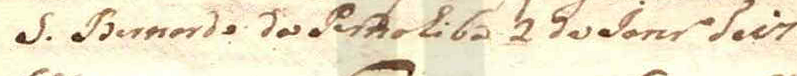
S. Bernardo da Pernahiba 2 de Ianr.o de i7
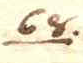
68.
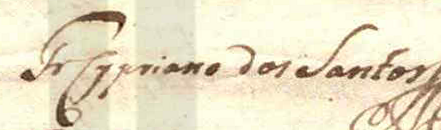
Fr Cypriano dos Santos
